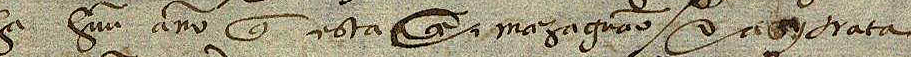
ha hu̅u an̅o q̅ esta e̅ mazaguão / e asy trata
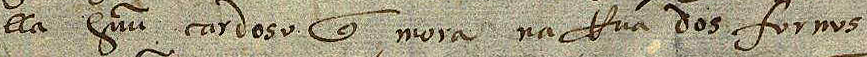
lla hu̅u cardoso q̅ mora na Rua dos fornos
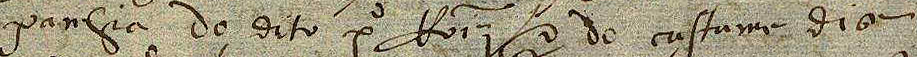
panhia do dito po Ro̅iz / e do custume dise
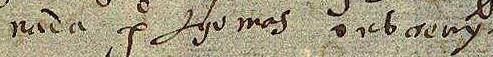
nada po thomas o escreuy
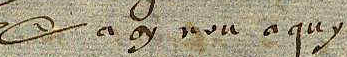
e asynou aquy
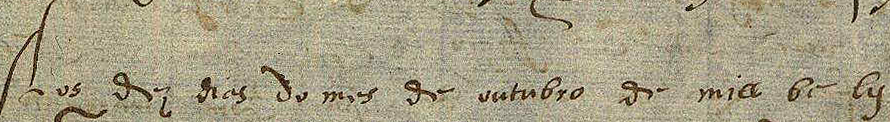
Aos dez dias do mes de outubro de mill bc lij
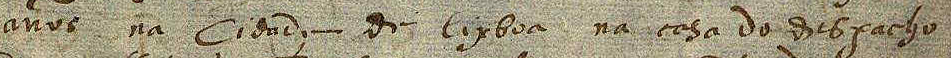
an̅os na Çidade de lixboa na casa do despacho
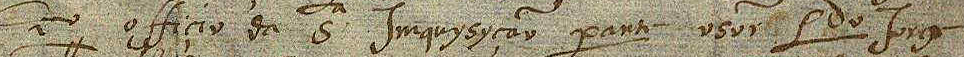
Do offiçio da Sta Jmquysyção ꝑante o so̅r Ldo Jorge
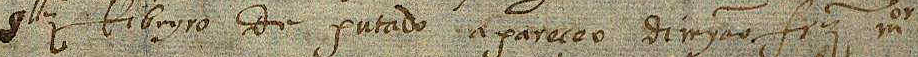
ḡllz Ribeyro Deputado apareçeo dimyão frz̅ mor
